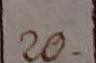20
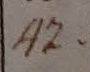42
